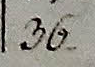36
